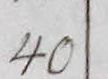40
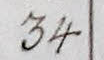34
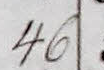46
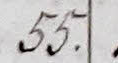55.
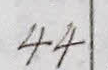44
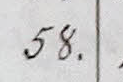58.
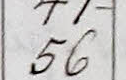56
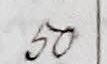50
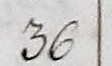36
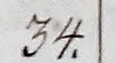34
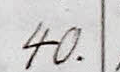40.
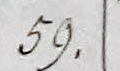59.
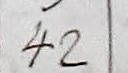42
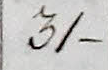31
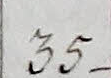35
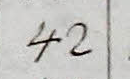42
